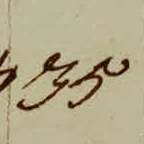35
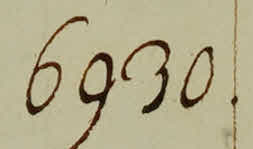6930
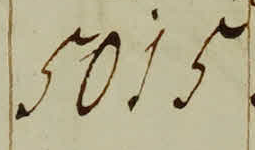5015
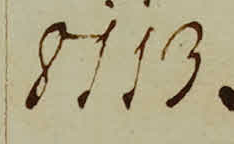8113
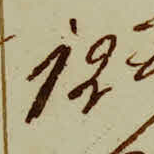12
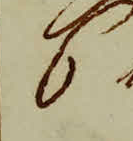6
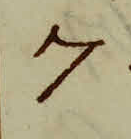7
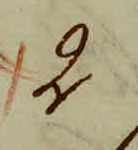2
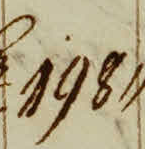198
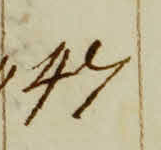47
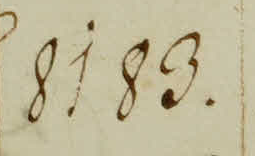8183.
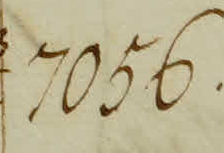7056
